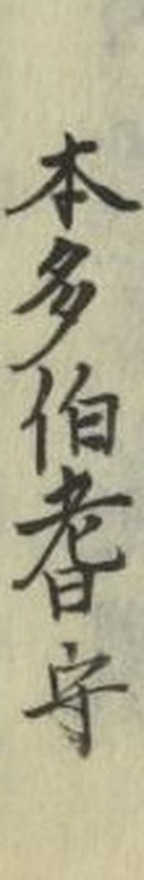本多伯耆守
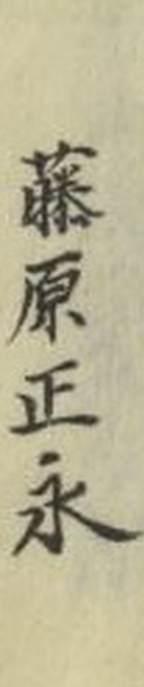藤原正永
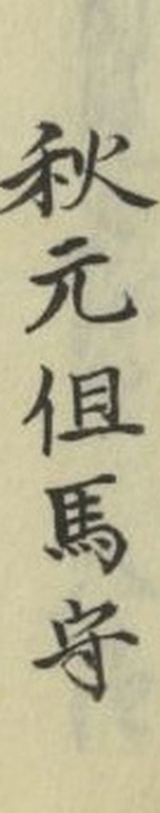秋元但馬守
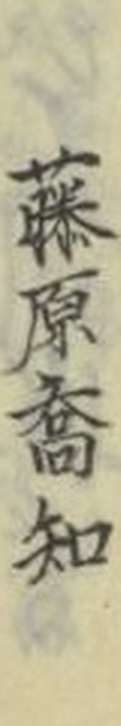藤原喬知
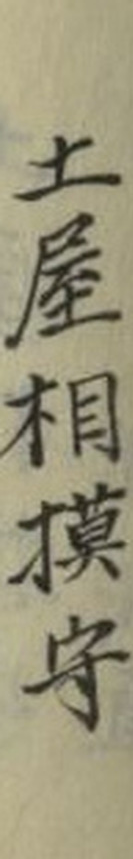土屋相模守
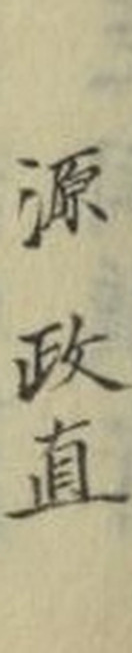源政直

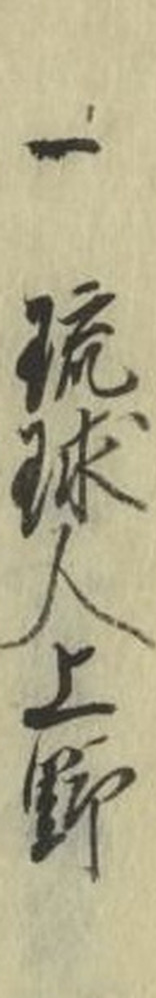一琉球人上野
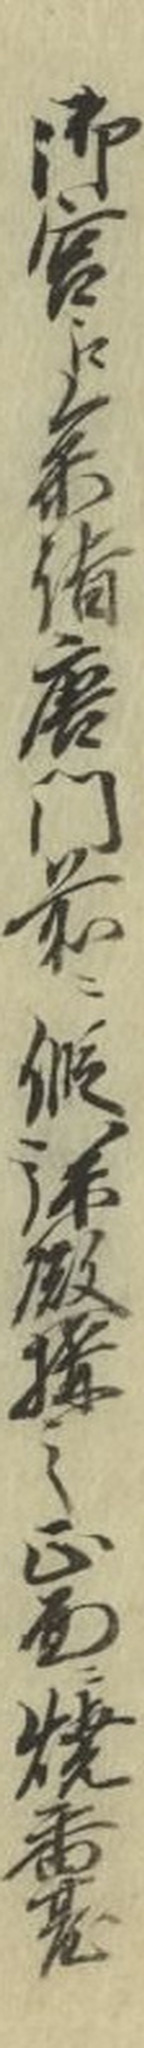御宮え参詣唐門前に仮拝殿構之正面に焼香台
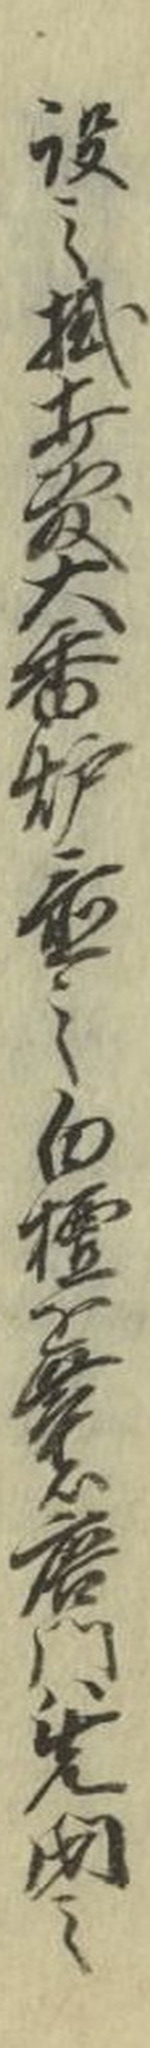設之掛打敷大香炉置之白檀を唐門は先閉之
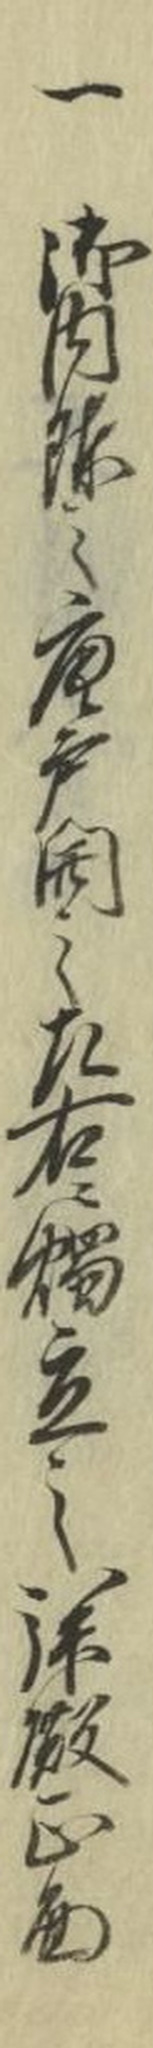一御内陣之唐戸開之左右に燭立之拝殿正面
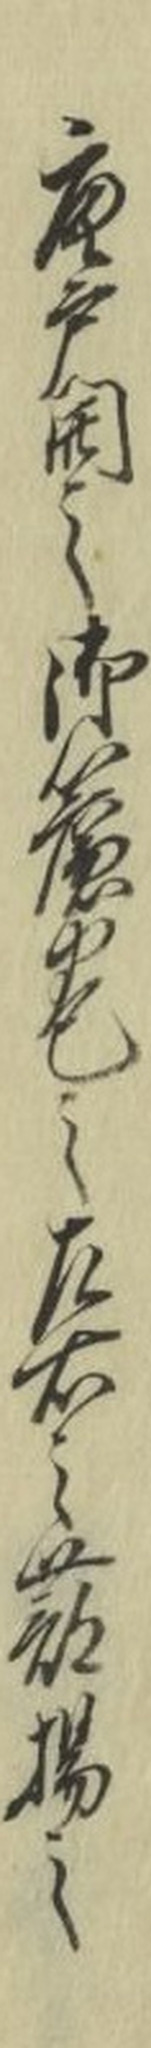唐戸開之御簾巻之左右之蔀揚之
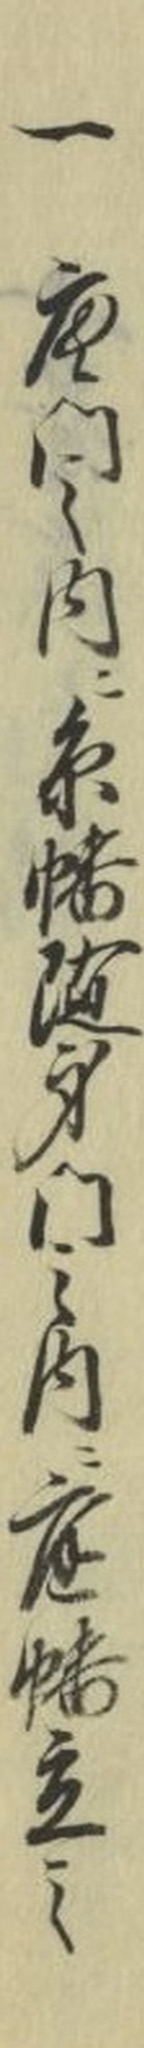一唐門之内に糸幡随身門之内に庭幡立之
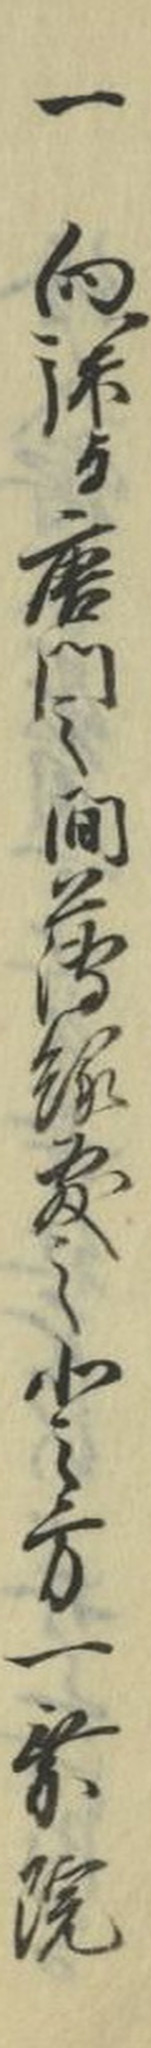一向拝ゟ唐門之間薄縁敷之北之方一乗院
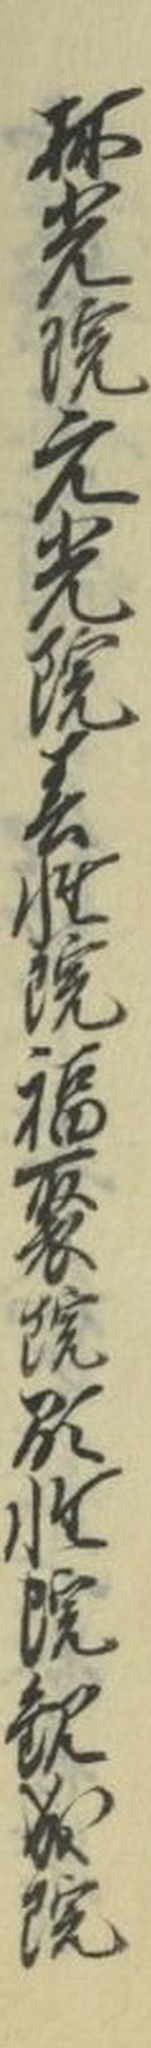林光院元光院春性院福聚院顕性院観成院
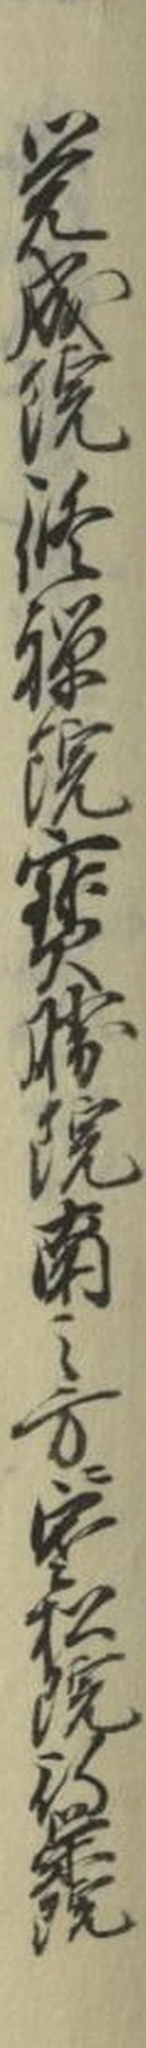覚成院修禅院宝勝院南之方に寒松院行栄院
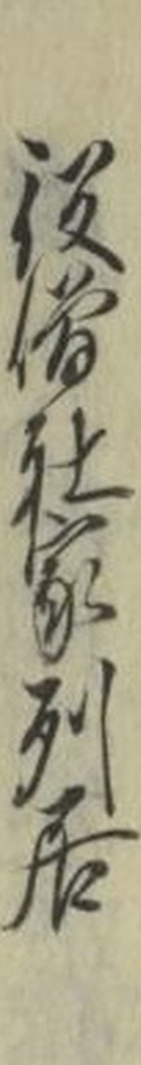役僧社家列居
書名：琉球人参府記
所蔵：University of the Ryukyus Library
